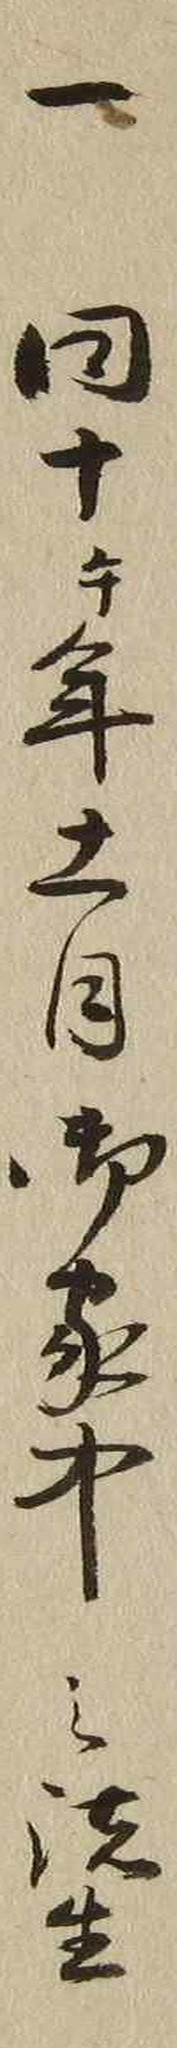一同十午年十一月御家中之諸生
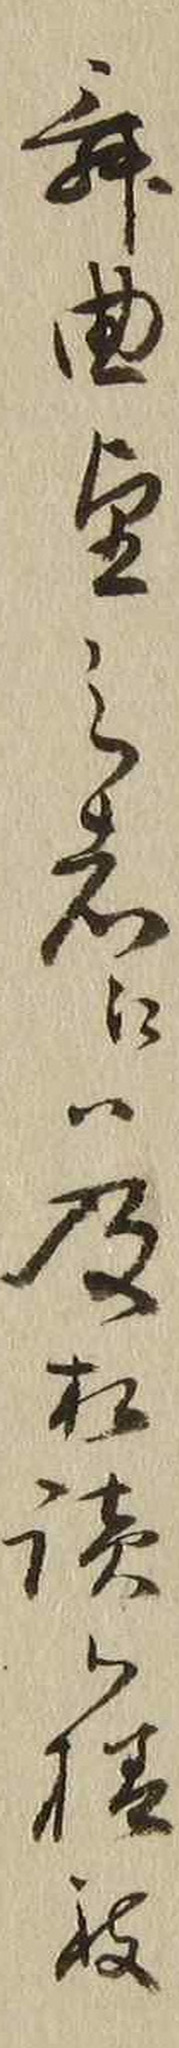舞曲望之者江ハ及相談候様被
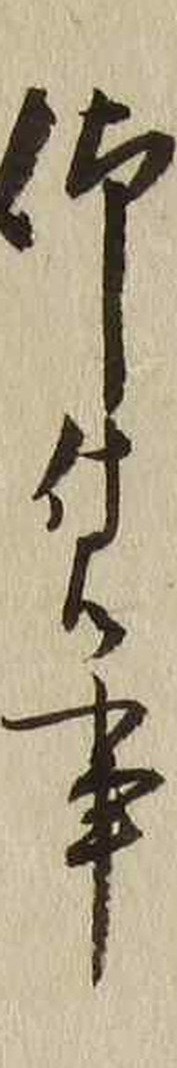仰付候事
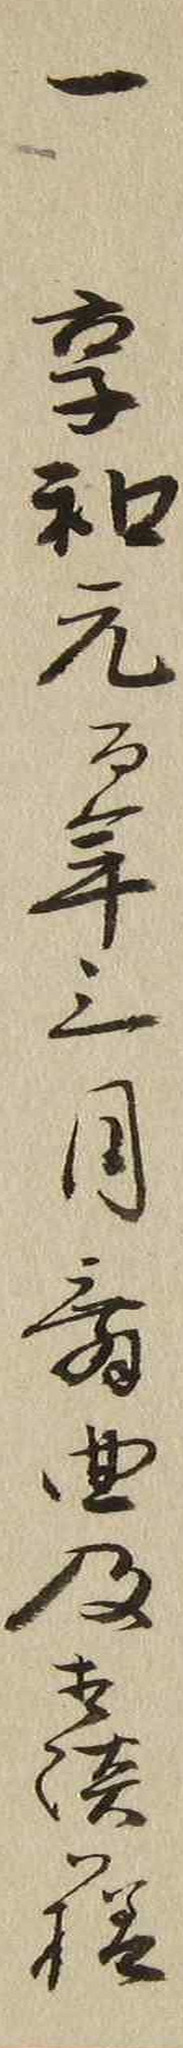一享和元酉年三月舞曲及相談候様
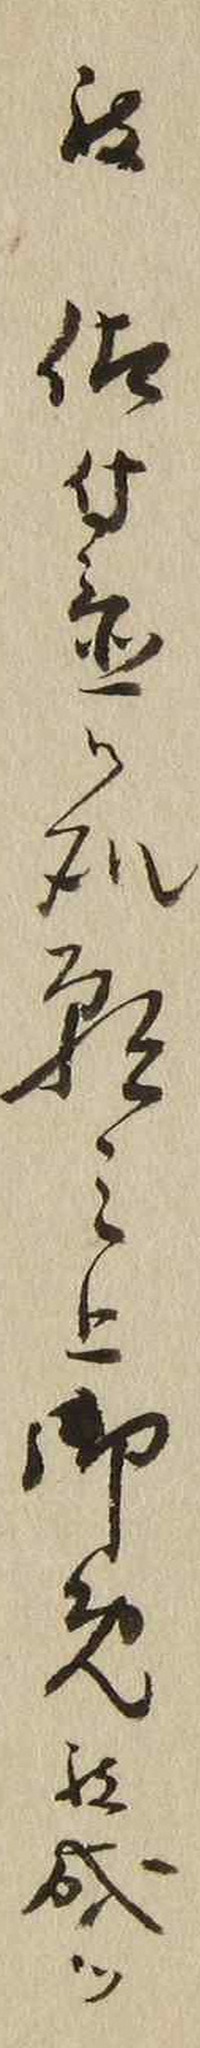被仰付置候処願之上御免被成候
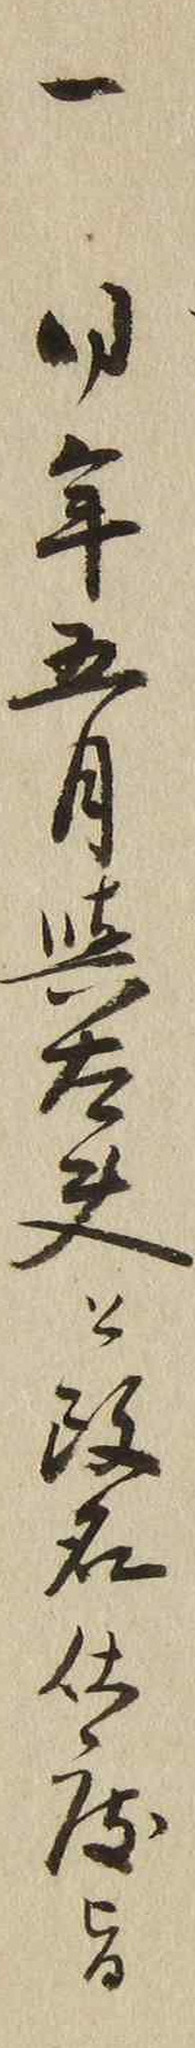一同年五月与太夫と改名仕度旨
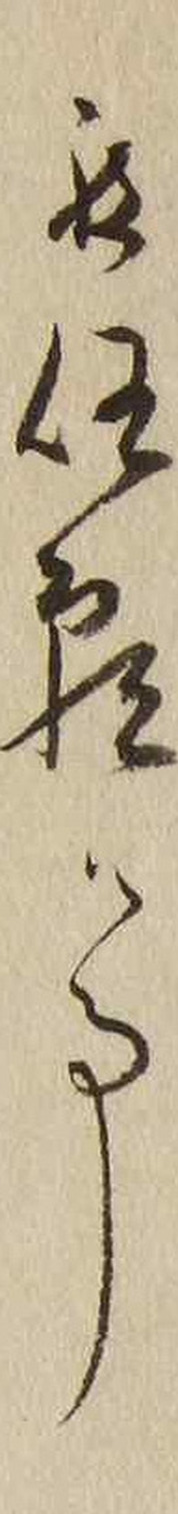被任願候事

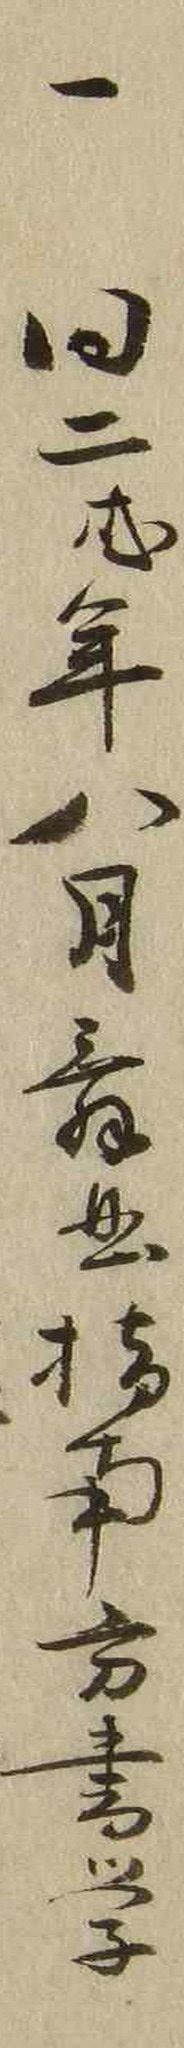一同二戌年八月舞曲指南方書
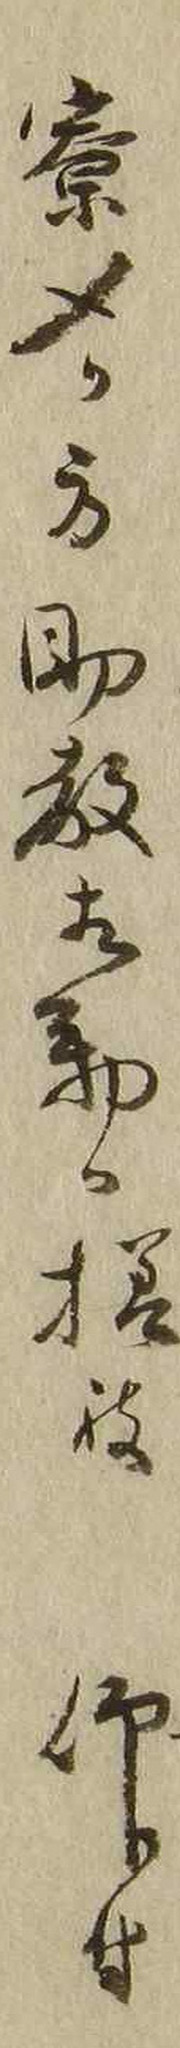学寮〆り方助教相勤候様被仰付
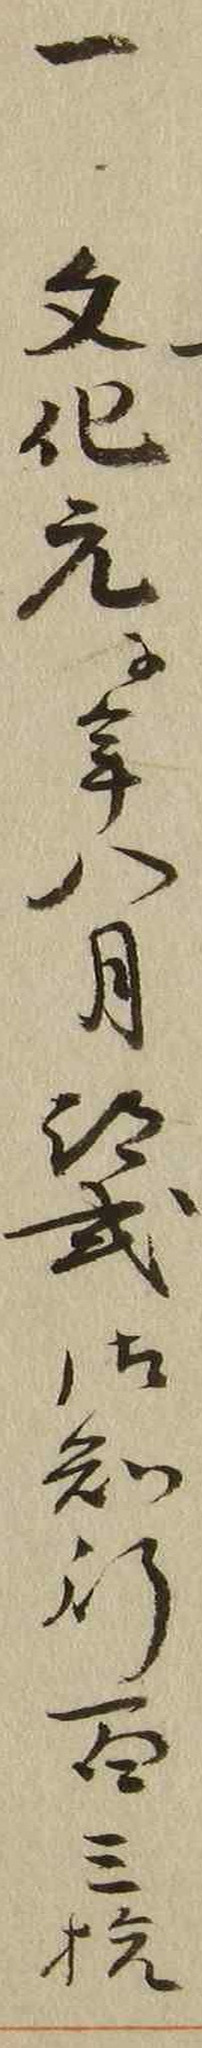一文化元子年八月跡式御知行百三拾
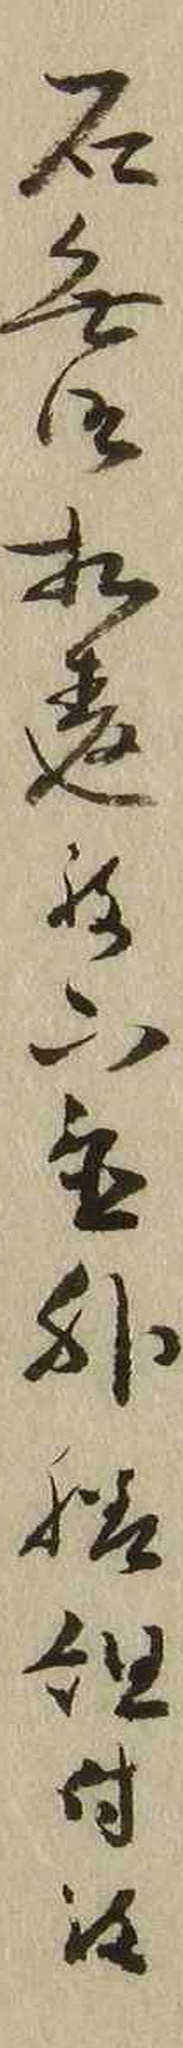石無御相違被下置外様組付被
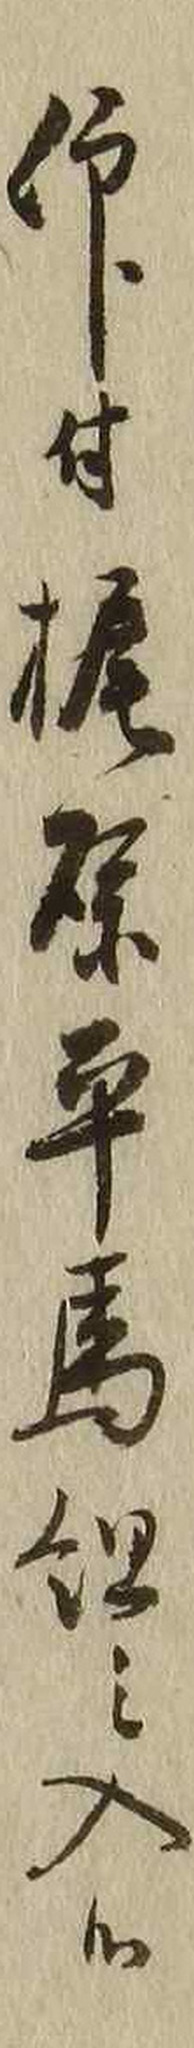仰付梶原平馬組ニ入候
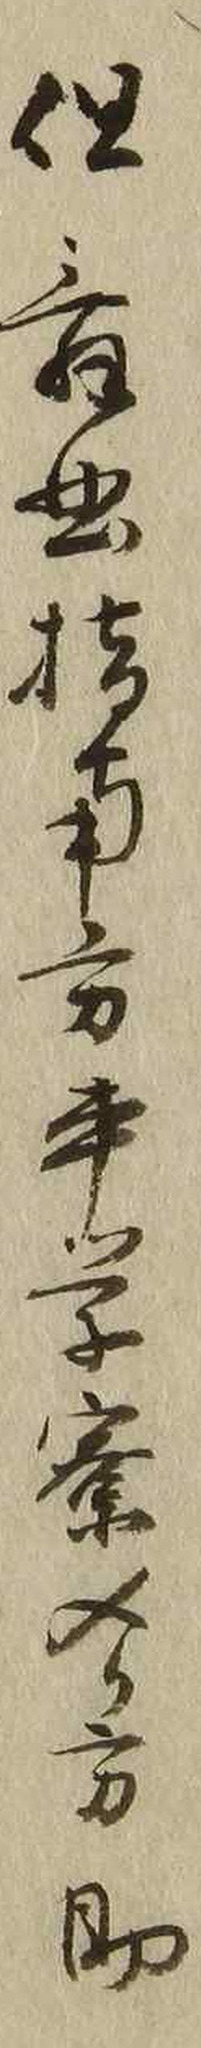但舞曲指南方書学寮〆り方助
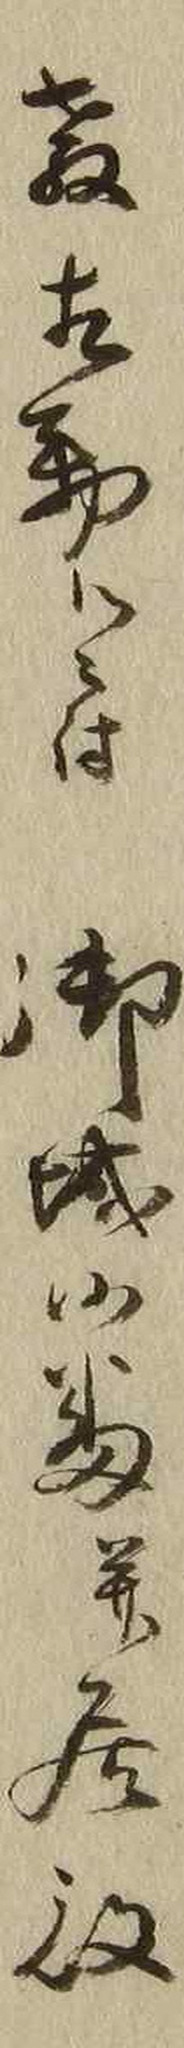教相勤候ニ付御城御番并居役
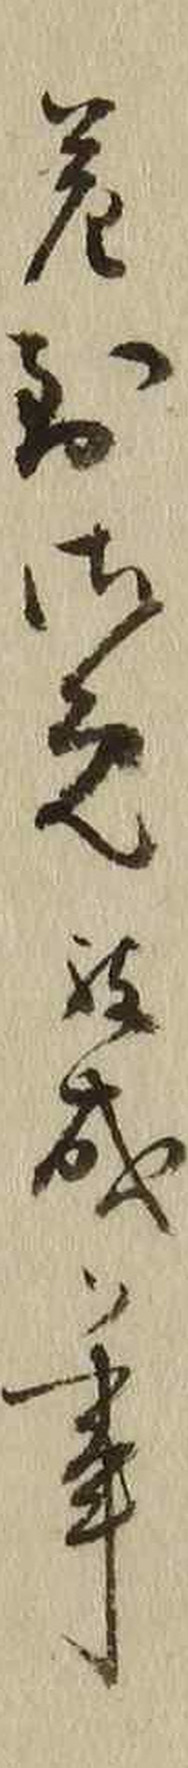差到御免被成候事
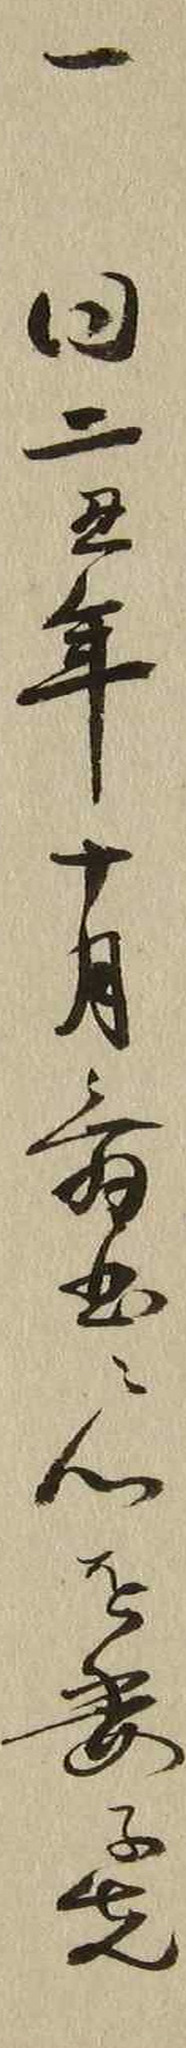一同二丑年十月舞曲ニ心を委に先
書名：諸士系譜　巻之221　ま之部2
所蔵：会津若松市立会津図書館
